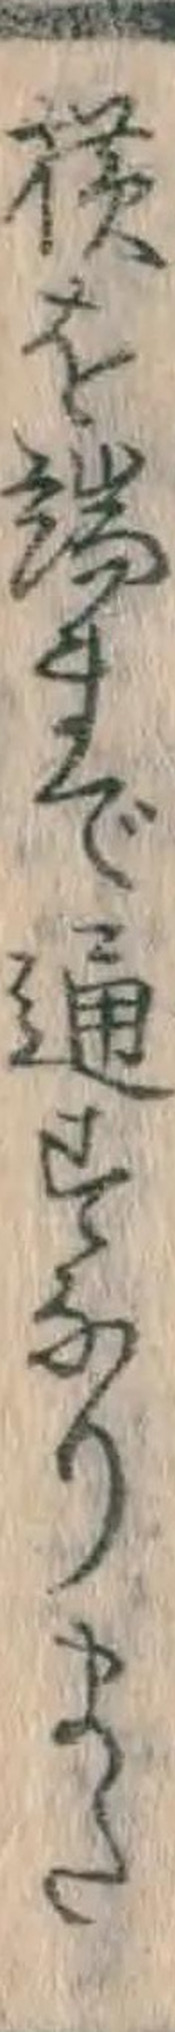横を端まで通すなりまた
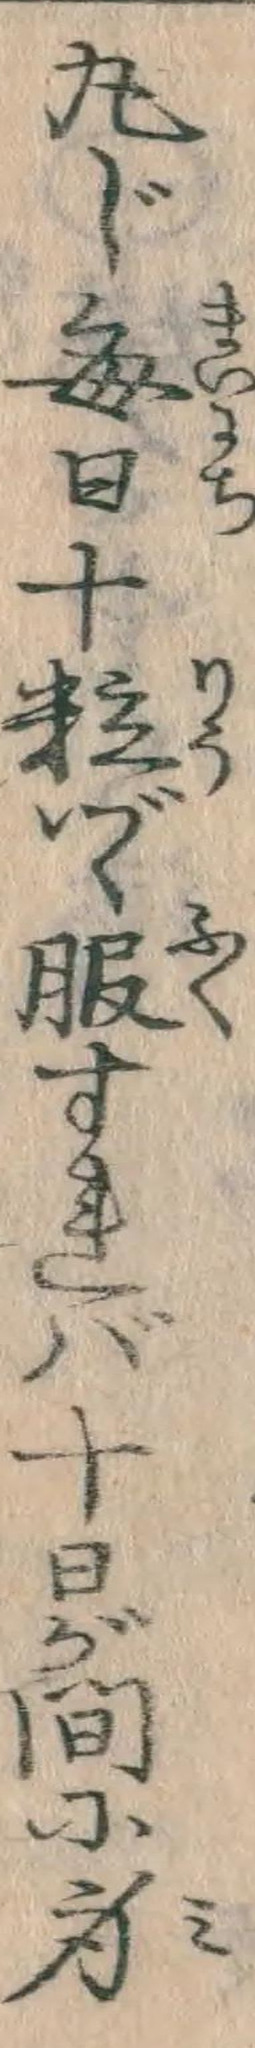丸じ毎日十粒ヅヽ服すれば十日が間に身
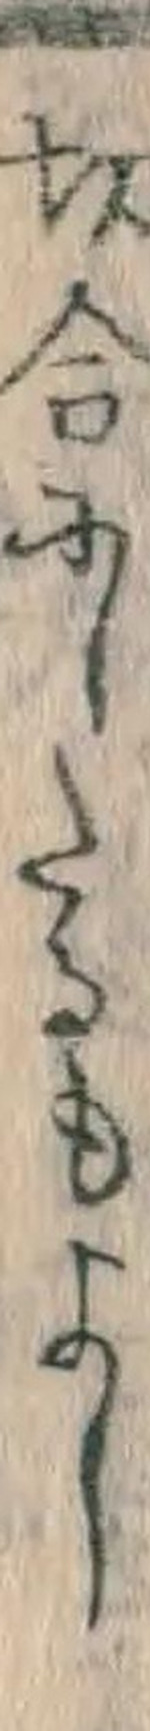切合にしたるもよし
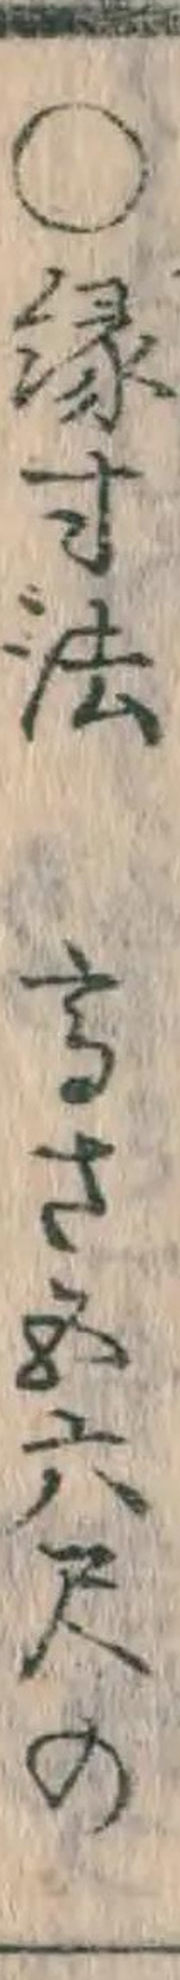○縁寸法高さ五六尺の
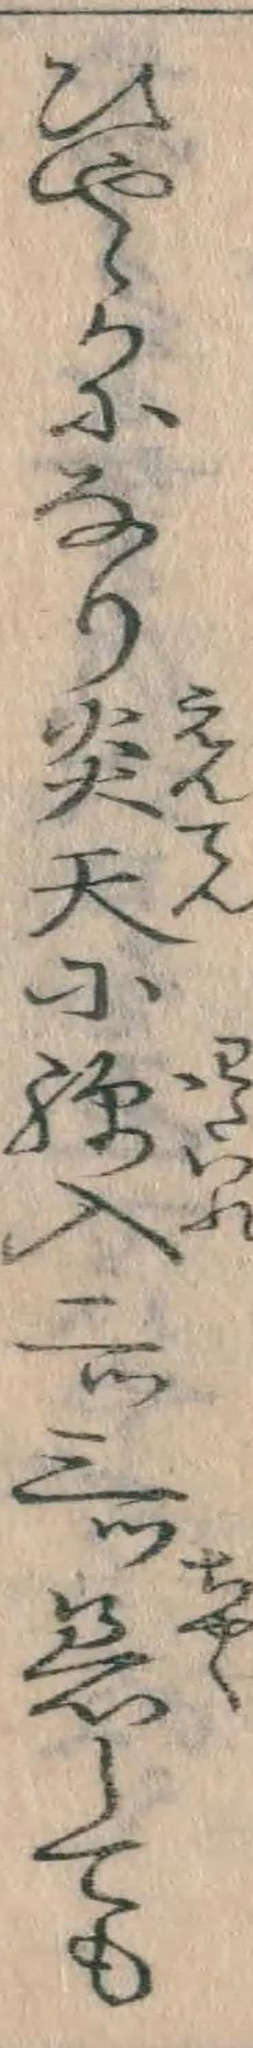ひやゝかになり炎天に綿入二ッ三ッ着しても
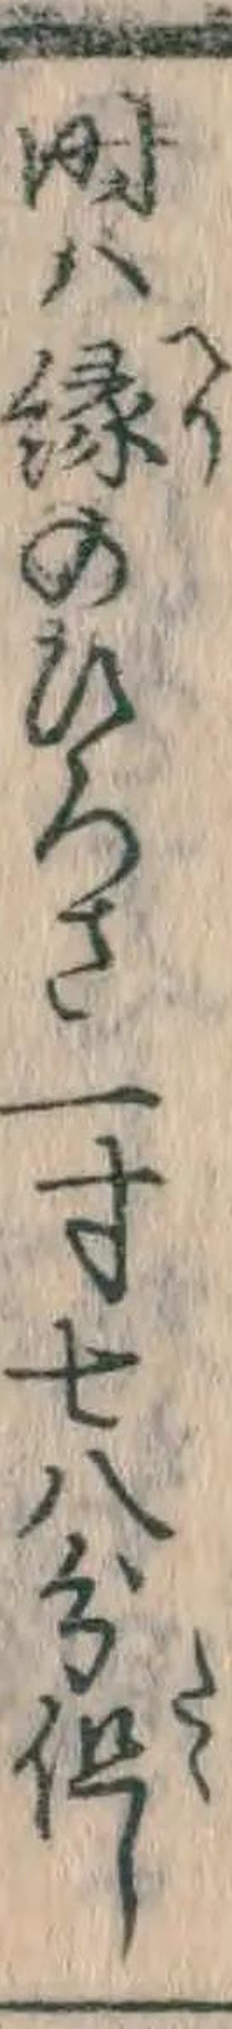時は縁のひろさ一寸七八分但し
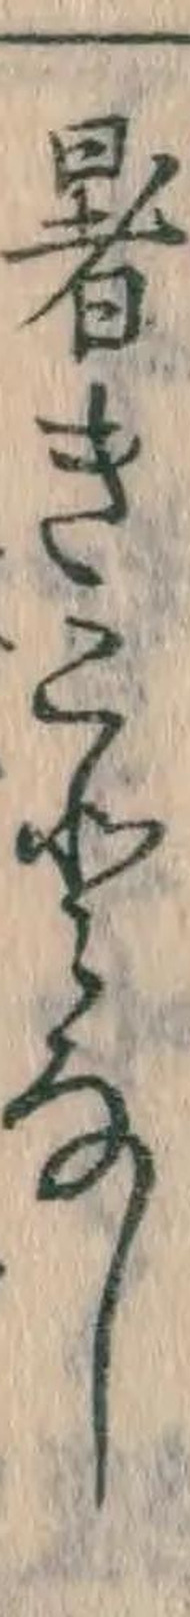暑きことなし
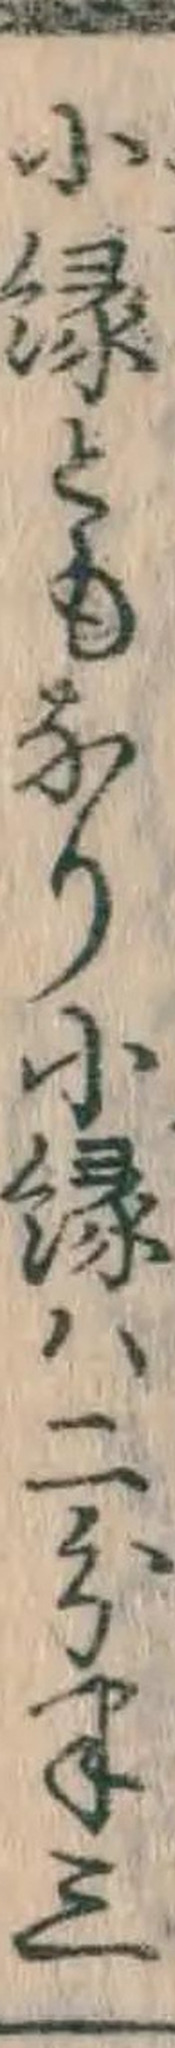子縁ともなり子縁は二分半三
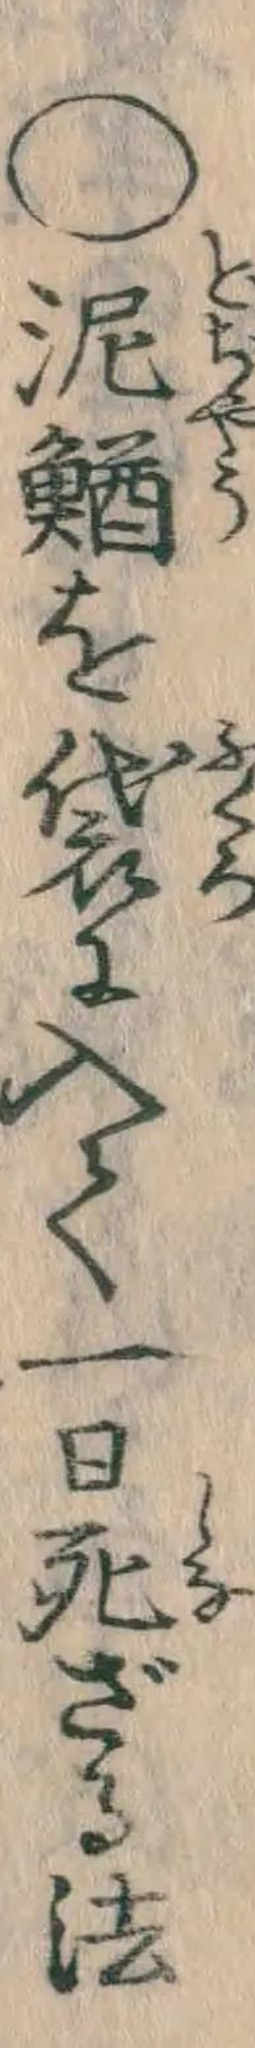○泥鰌を袋に入て一日死ざる法
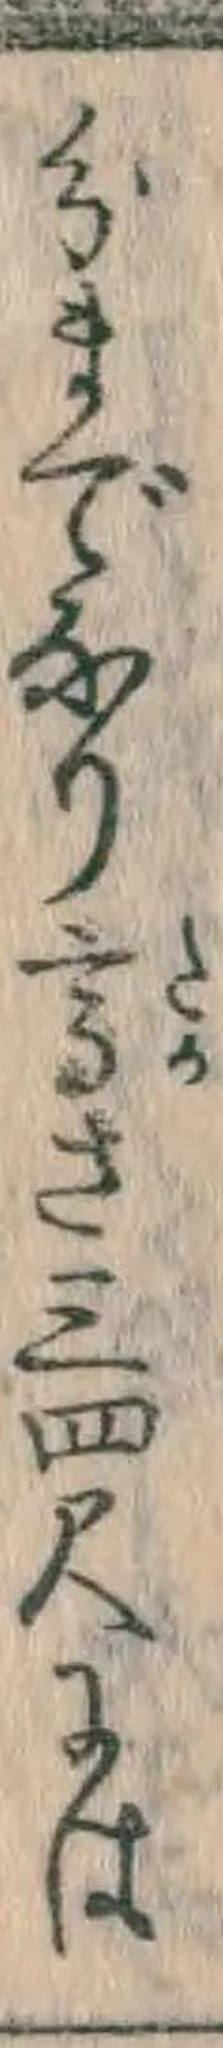分までなり高さ三四尺には
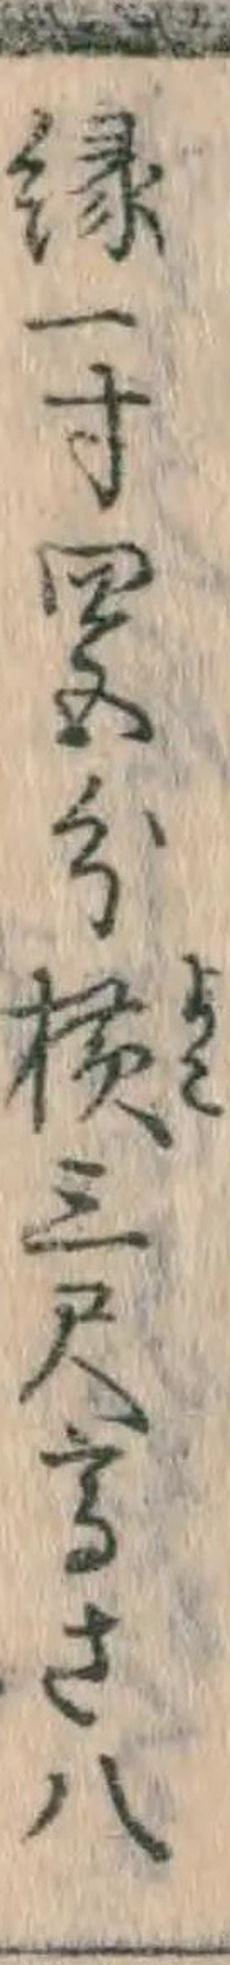縁一寸四五分横三尺高さ八
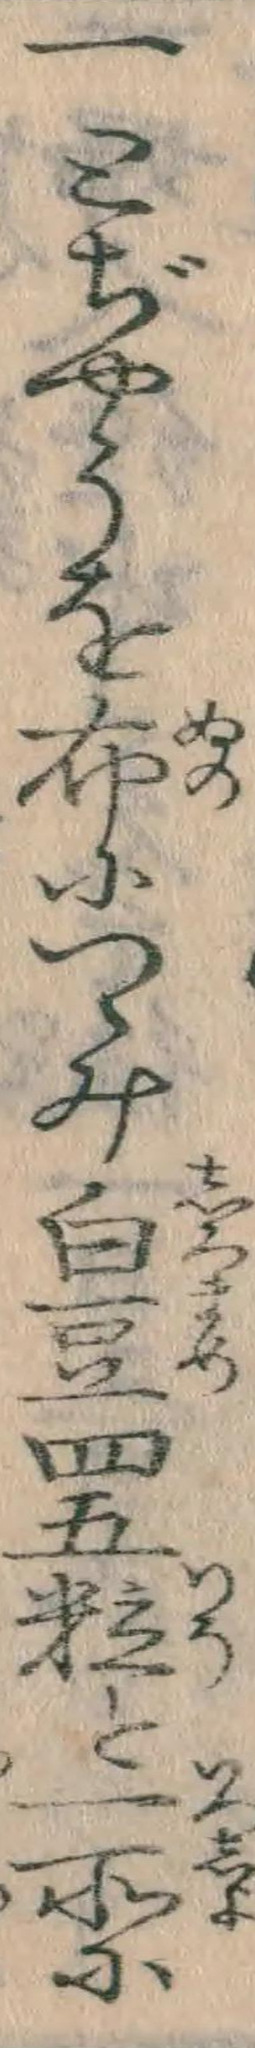一とぢやうを布につゝみ白豆四五粒と一所に
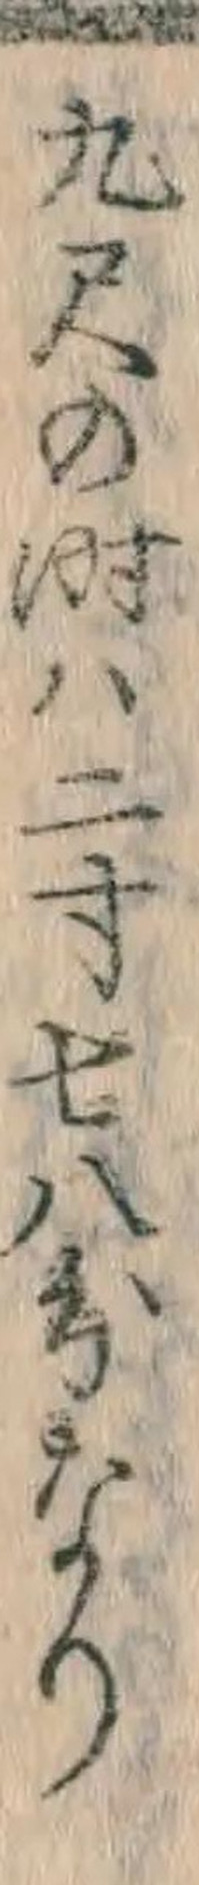九尺の時は二寸七八分なり
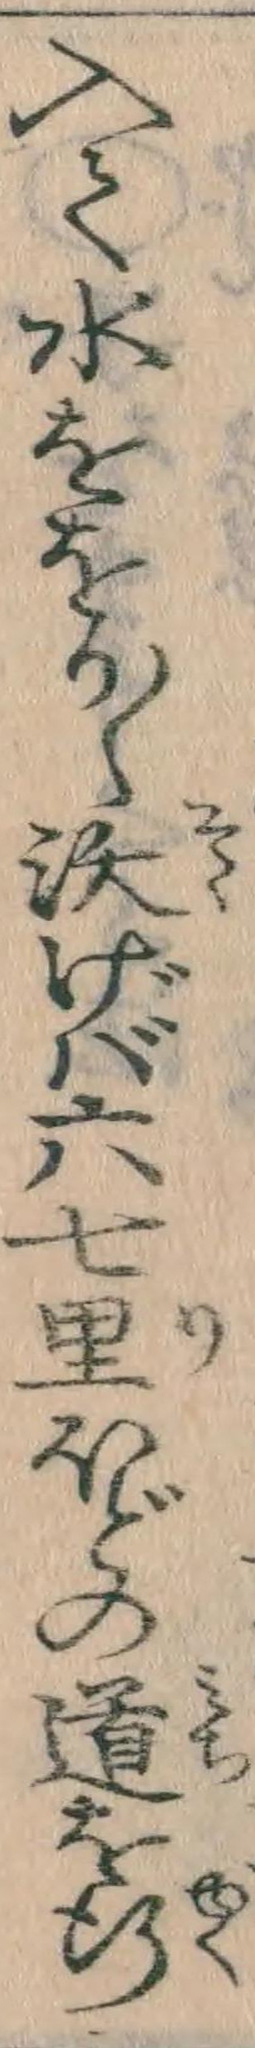入て水ををり〳〵沃げば六七里ほどの道を行
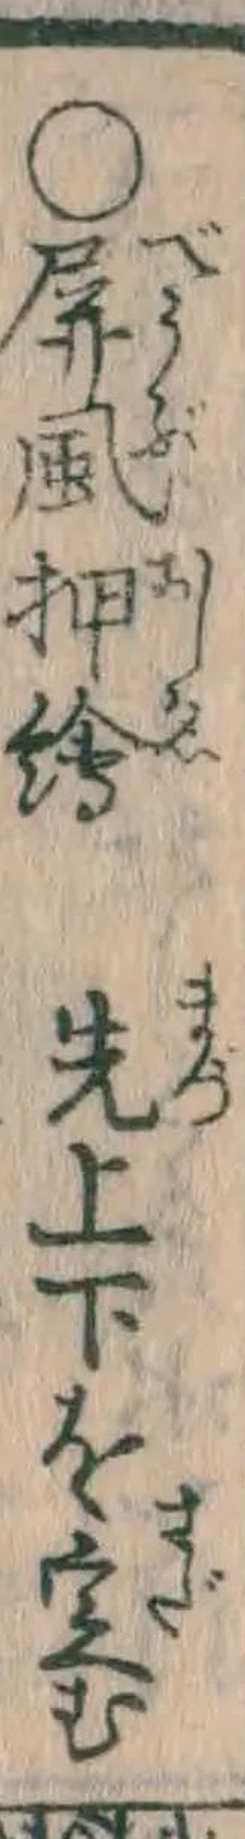○屏風押絵先上下を定む
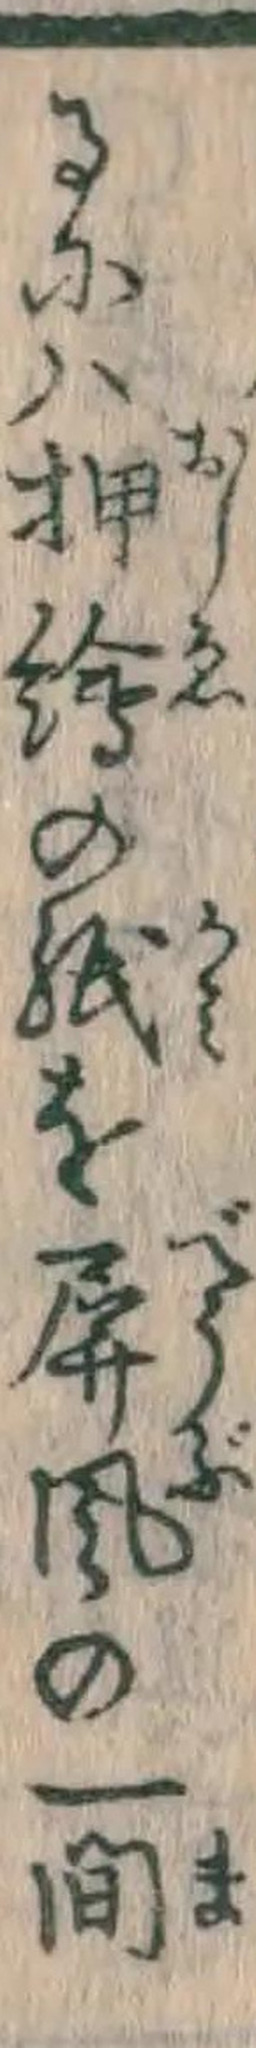るには押絵の紙を屏風の一間
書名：広益秘事大全 3巻. [2]
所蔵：国立国会図書館 National Diet Library, JAPAN
